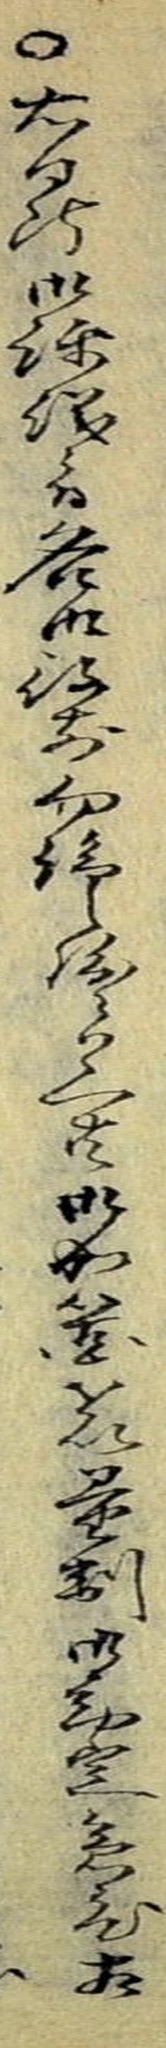○右同断御評議に付各御役前勿論之儀に候へ共御成箇を以量制御勘定急度相
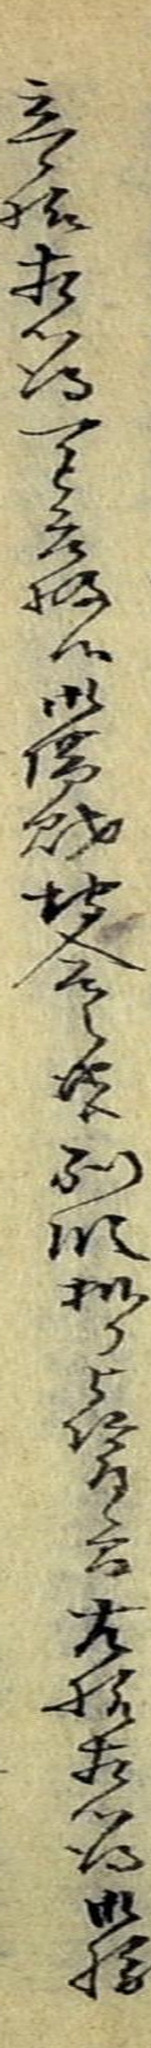立候様相心得可被取扱候御借財埒合之儀は別段掛り被仰付候間左様相心得御勝
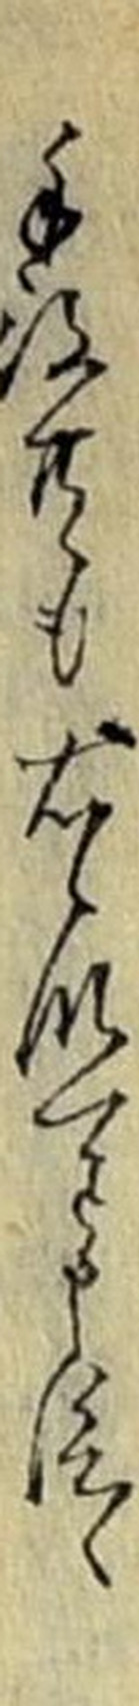手役共へも右之段可被申渡候
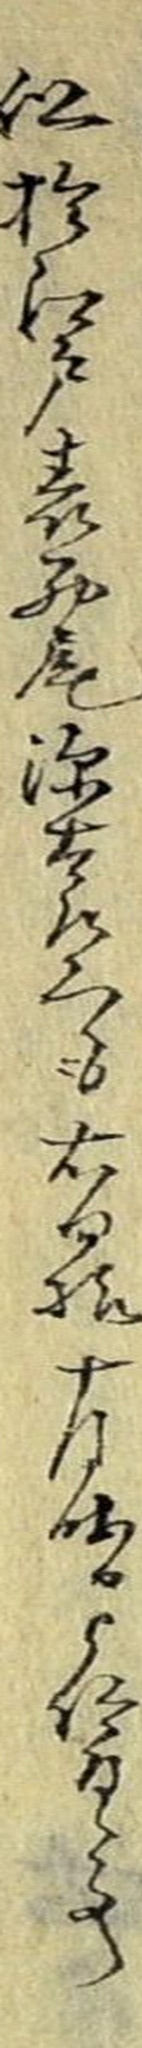但於江戸表西尾源太左衛門へも右同様十月晦日被付候事
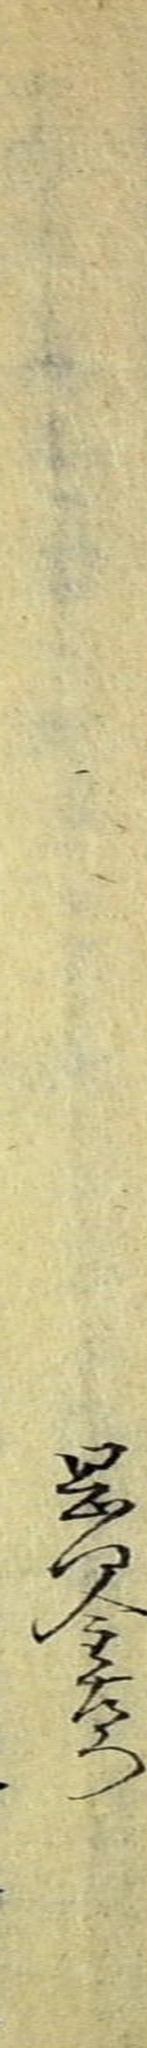岡田金左衛門
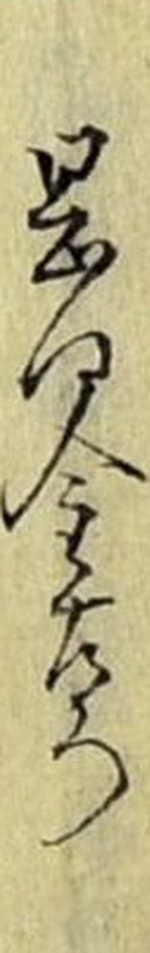岡田金左衛門
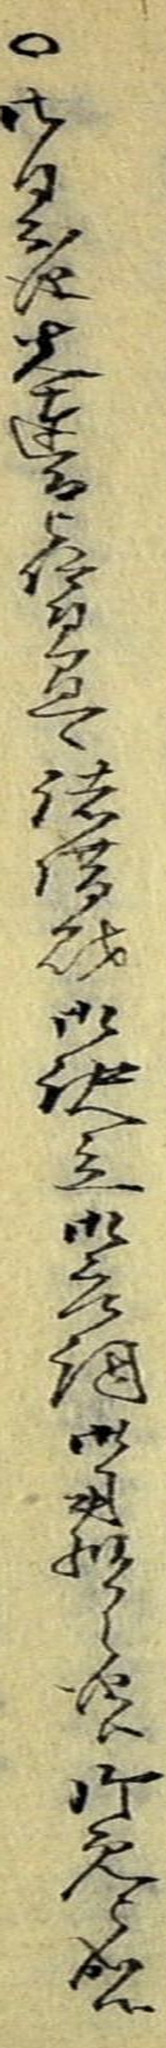○御自分儀先達而被仰付置候諸借財御訳立御取調御用掛り之儀は御免被成候
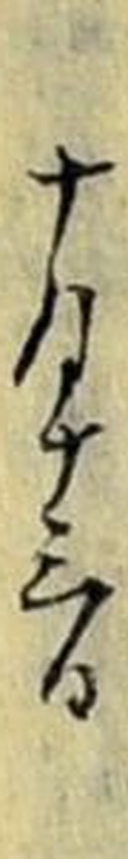十月十三日

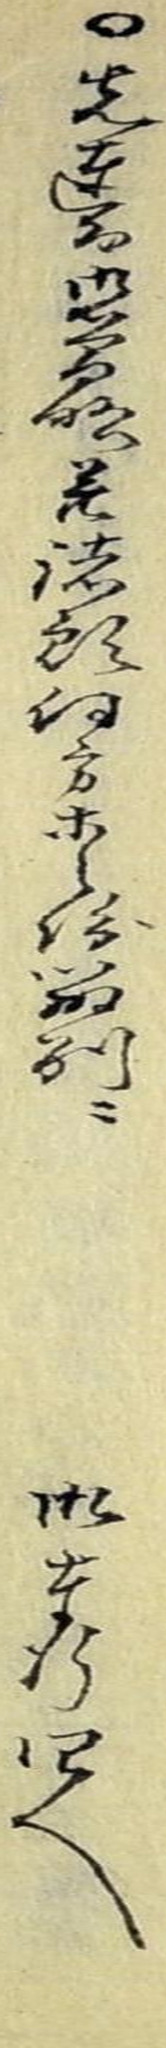○先達而御簡略并諸願何方等之儀弁別に御奉行四人
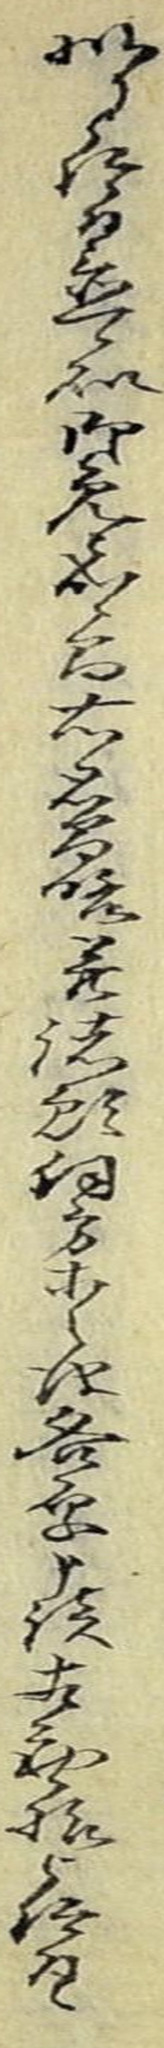掛り被仰付置候処御免被成候間右御簡略并諸願伺方等之儀各厚申談相勤候様被仰付候
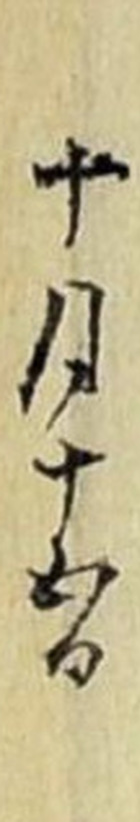十月十五日
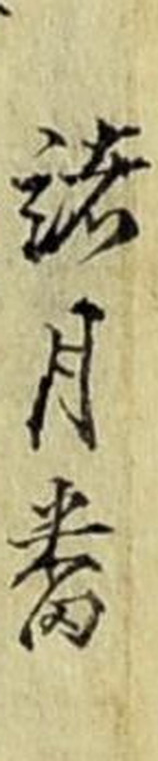諸月番
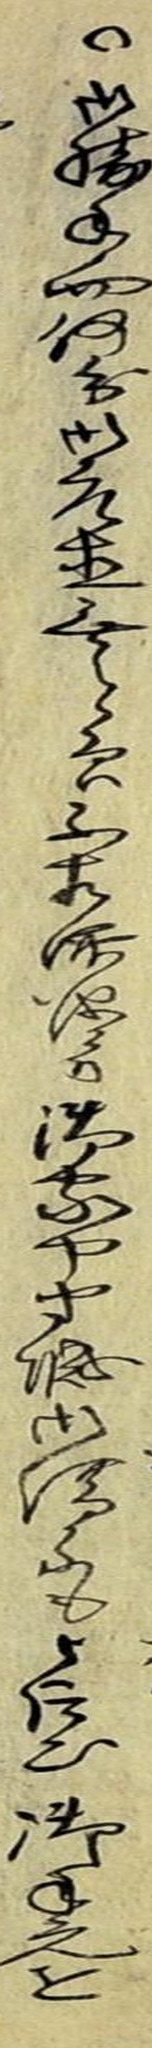○御勝手向何分御取直無之候而は不相済儀に付御家中半減御借米も被仰出御手元を
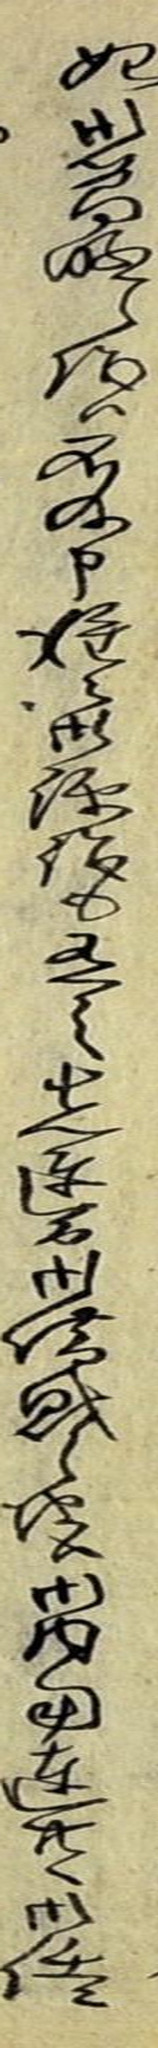始御簡略之儀は不及申種々御評議も有之先達而御借財之儀は御内用達共へ御任に
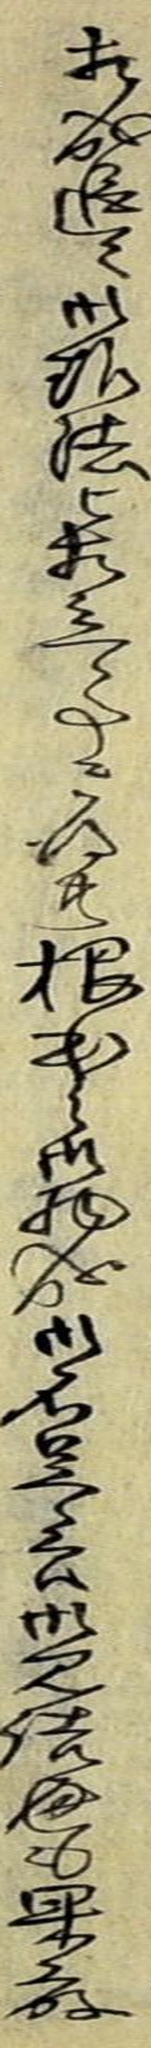相成追々御趣法被相立候事に候得共根本之御物成御不足候而は御見詰通も果敢
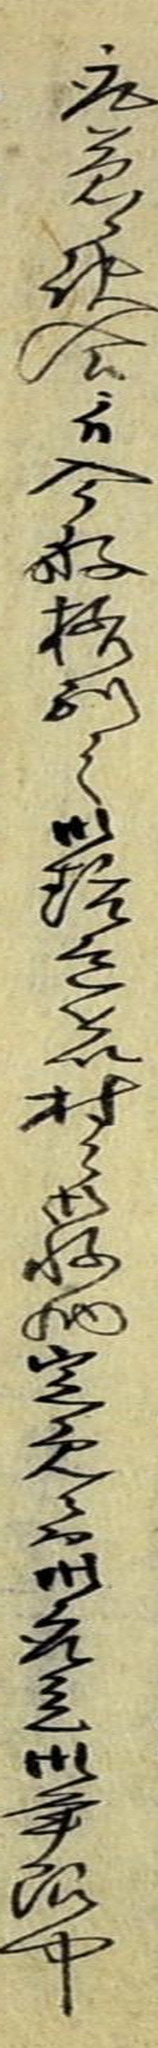取兼候訳合に付今般格別之御趣意を以村々御収納定免に而御取立御年限中
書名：命令之部 六
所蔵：福井県文書館 Fukui Prefectural Archives
